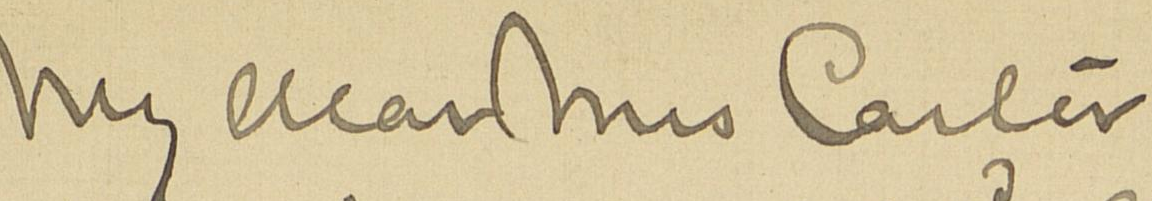My dear Mis Carter
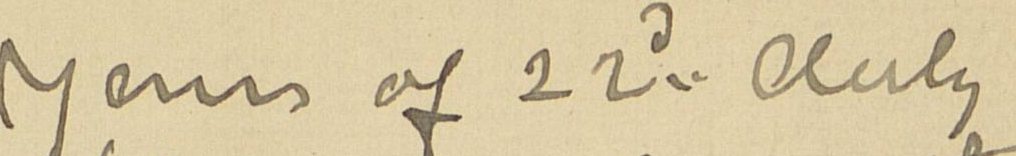yours of 22^d. duly
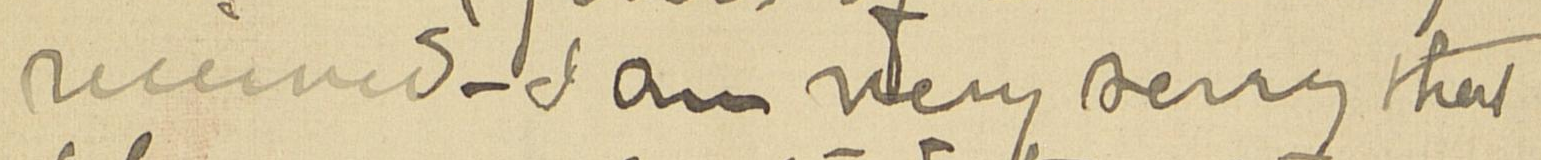received. I am very sorry that
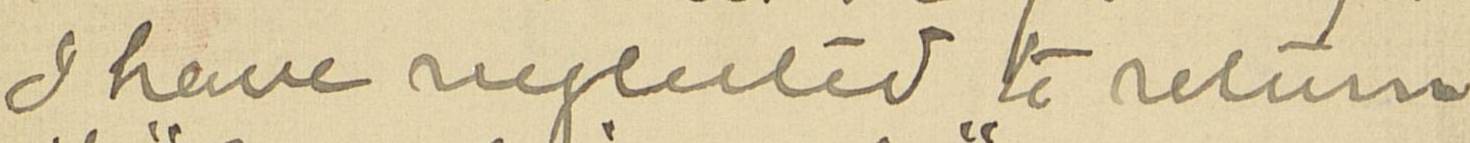I have neglected to return
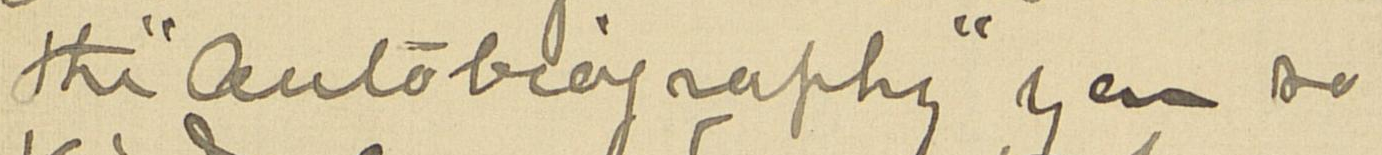the "Autobiography" you so
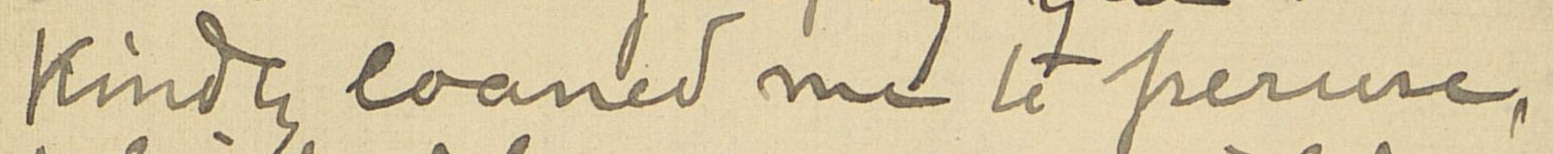kindly loaned me to peruse,
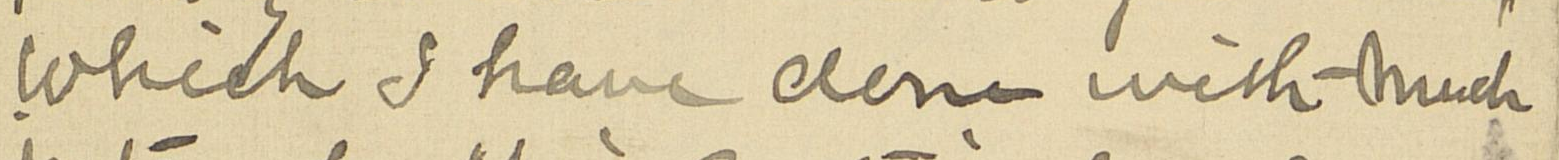which I have done with much
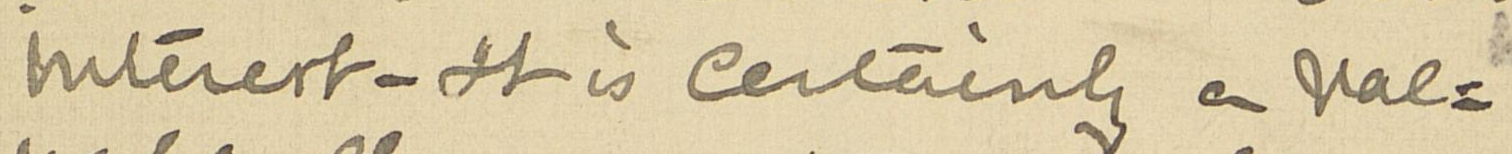interest. It is certainly a val-
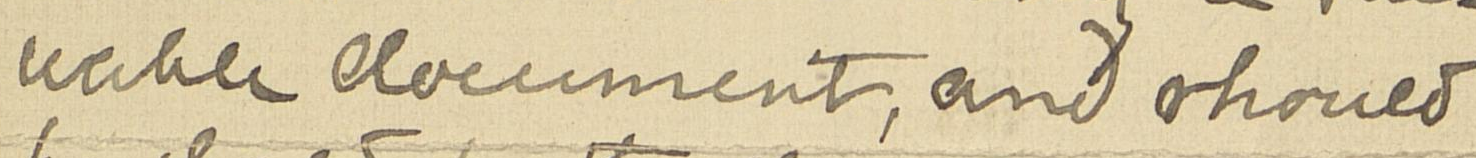-uable document, and should
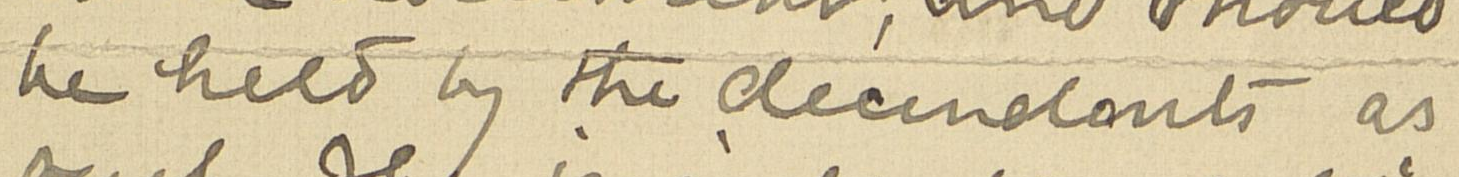be held by the decendants as
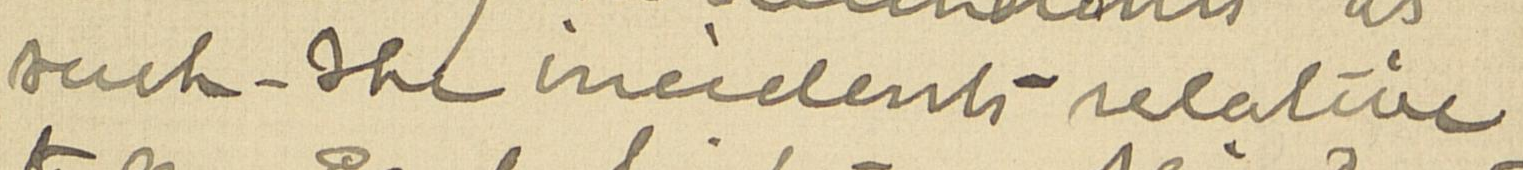such. The incidents relative
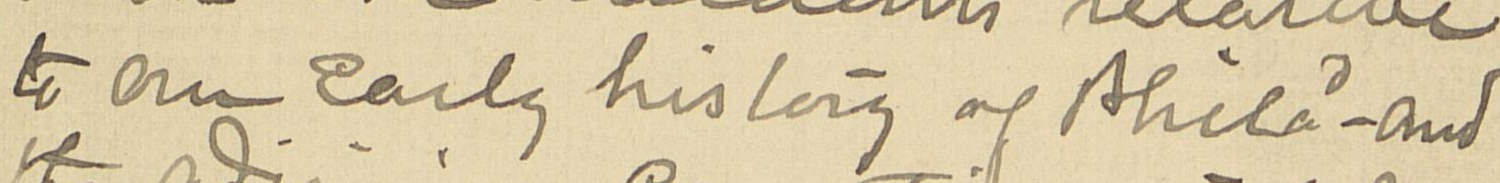to an Early history of Phila^d, and
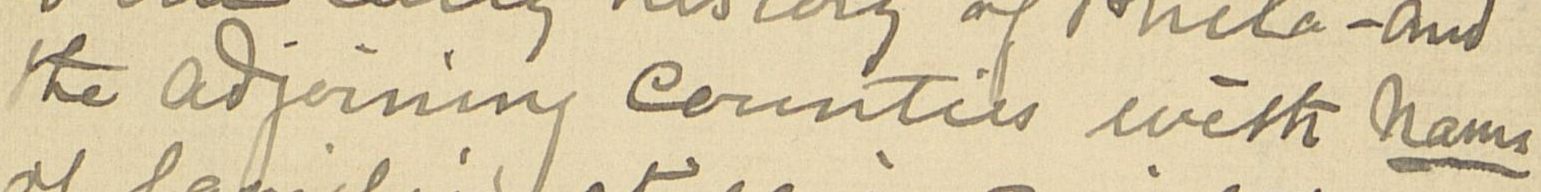the adjoining counties with names
